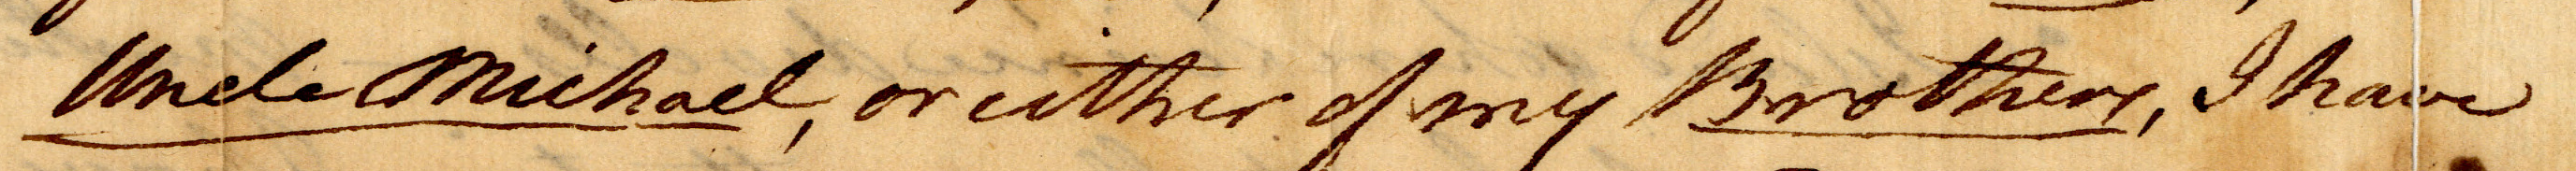Uncle Michael, or either of my Brothers, I have
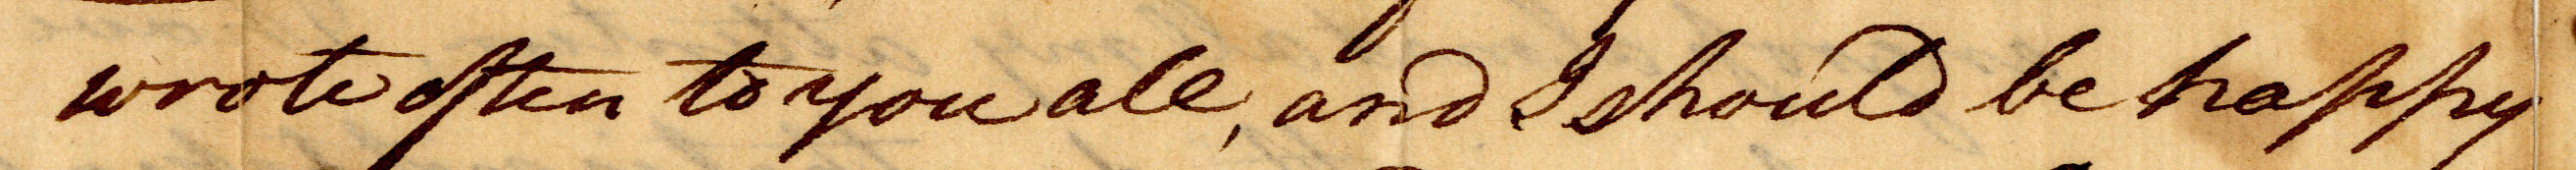wrote often to you all, and I should be happy
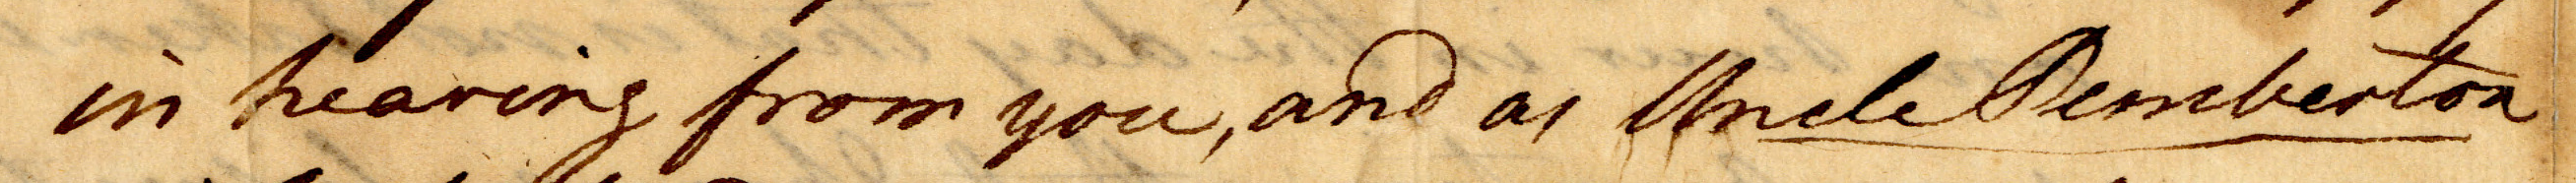in hearing from you, and as Uncle Pemberton
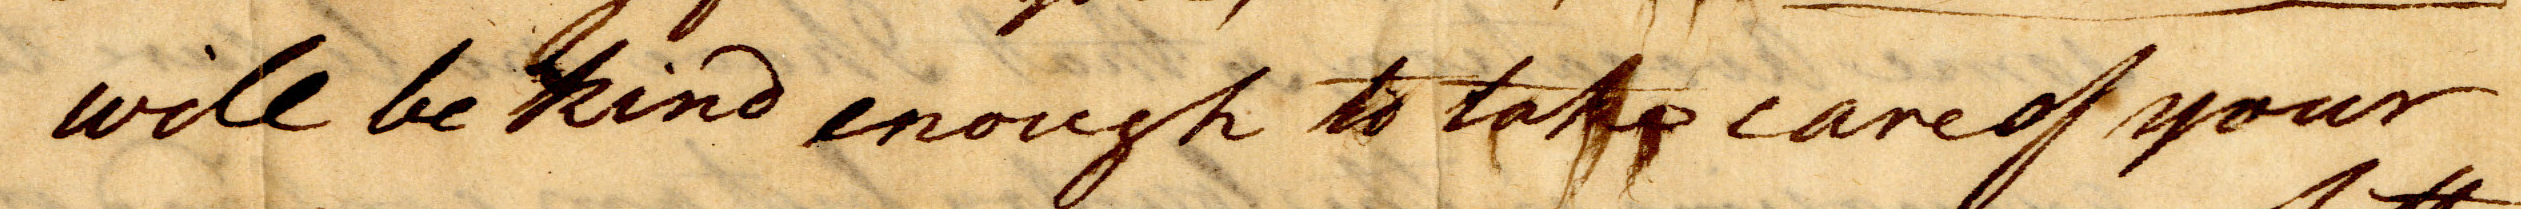will be kind enough to take care of your
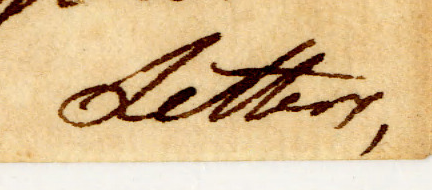Letter,
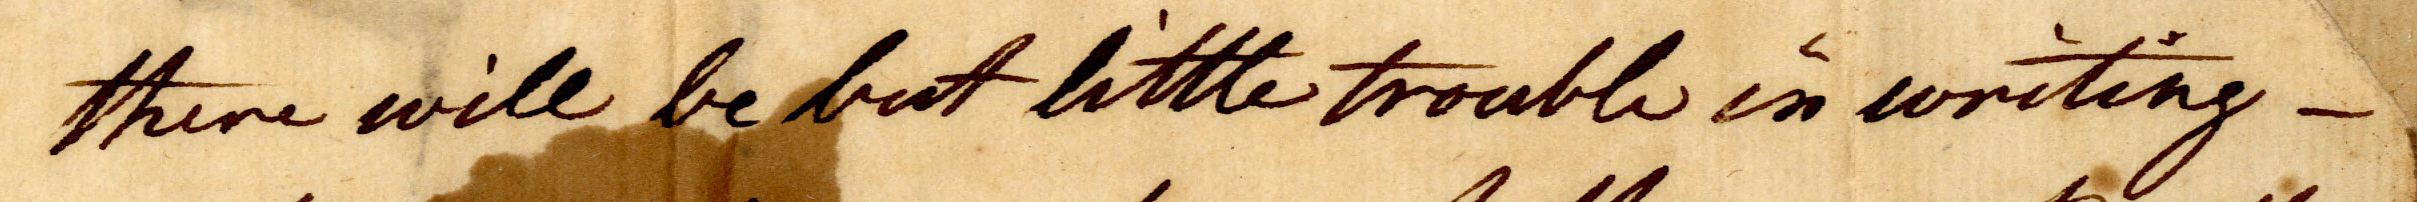there will be but little trouble in writing-
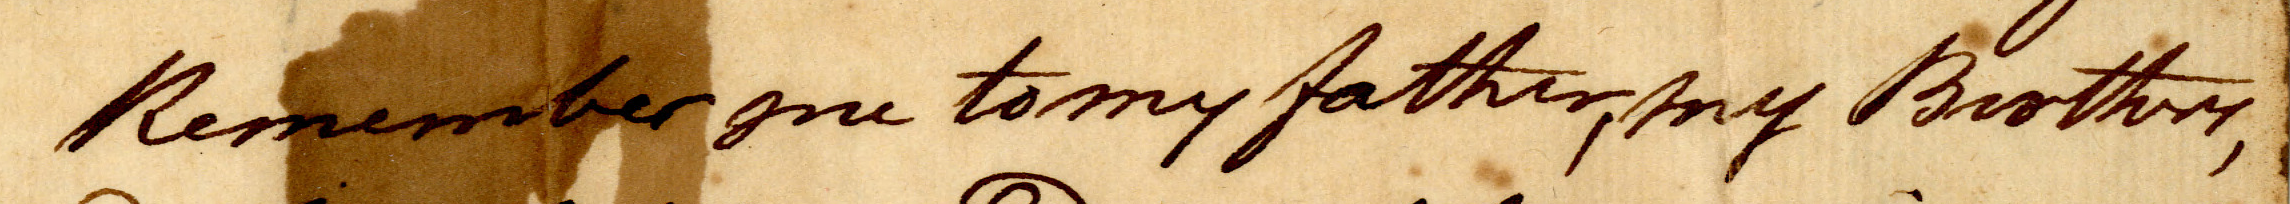Remember me to my father, my Brothers,
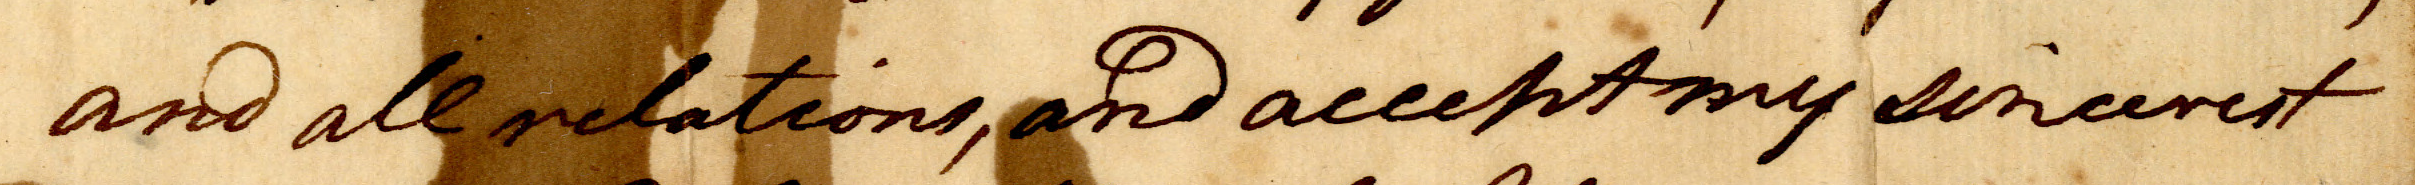and all relations, and accept my sincerest
